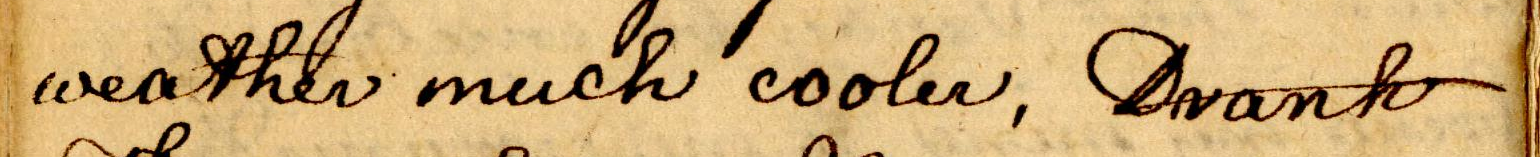weather much cooler, Drank
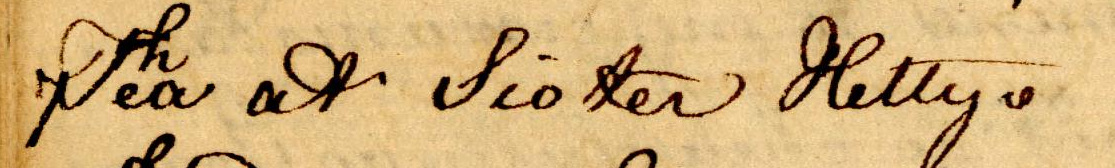7^th Tea at Sister Hettys
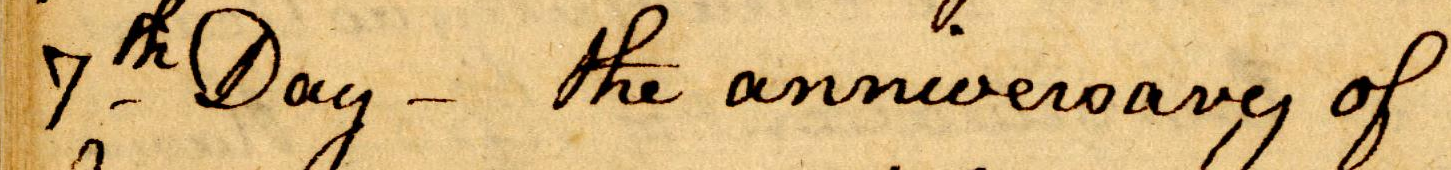7^th Day- the anniversary of
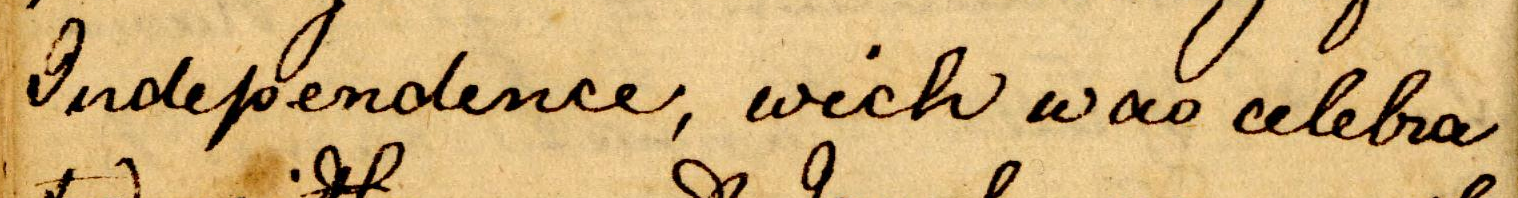Independence, wich was celebra
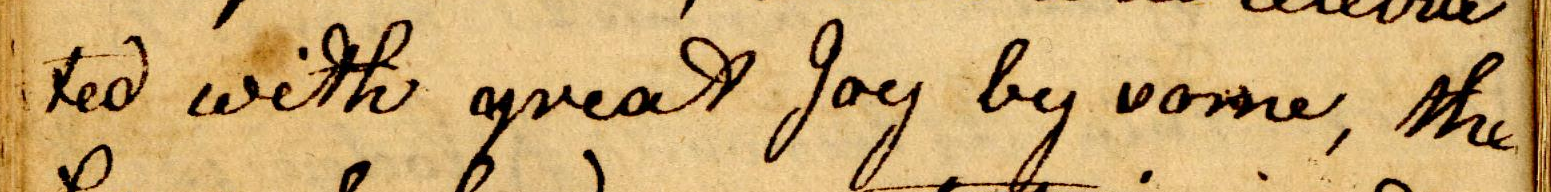ted with great Joy by some, the
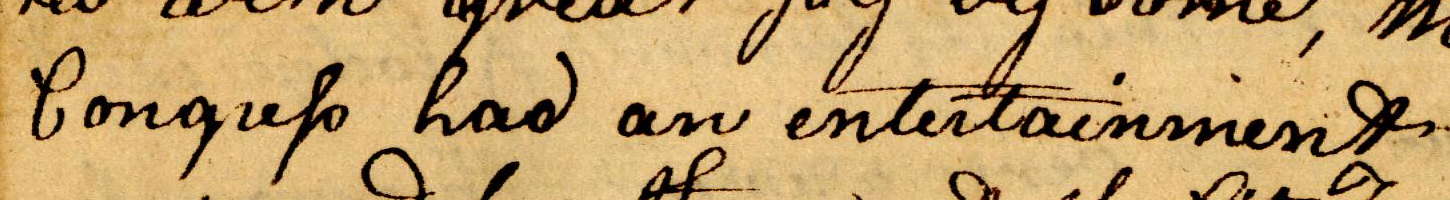Congress had an entertainment
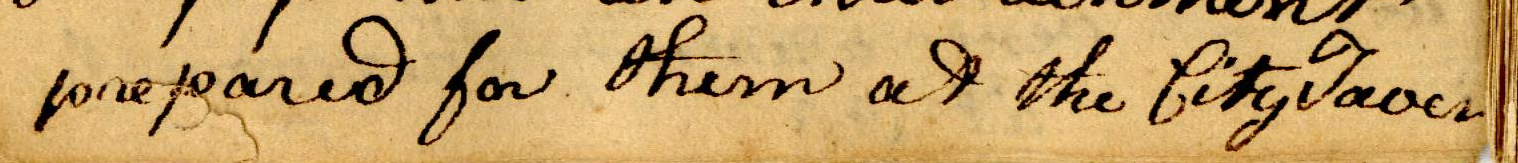prepared for them at the City Taver
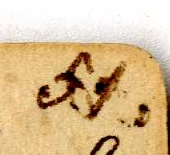51
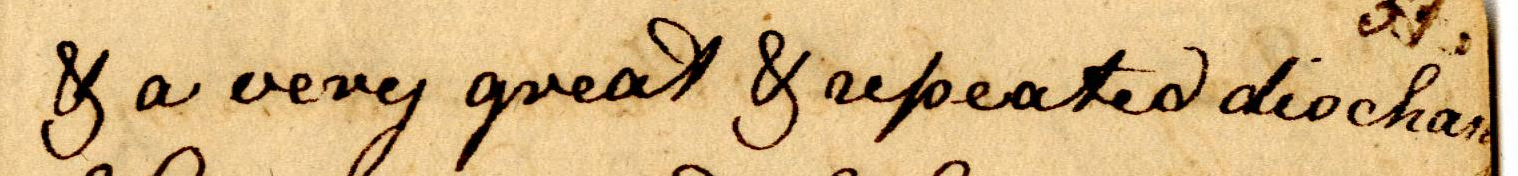& a very great & repeated discharg
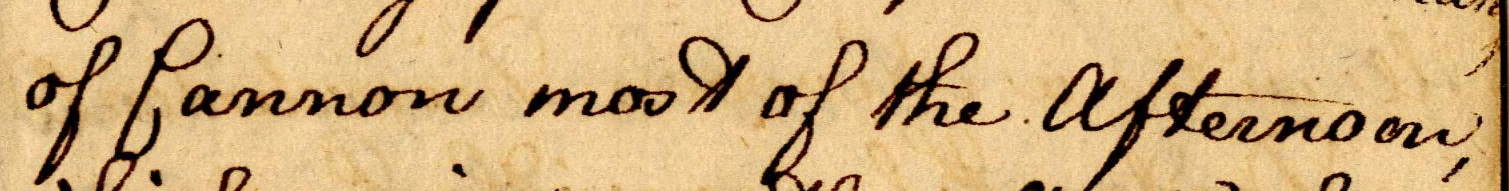of Cannon most of the Afternoon,
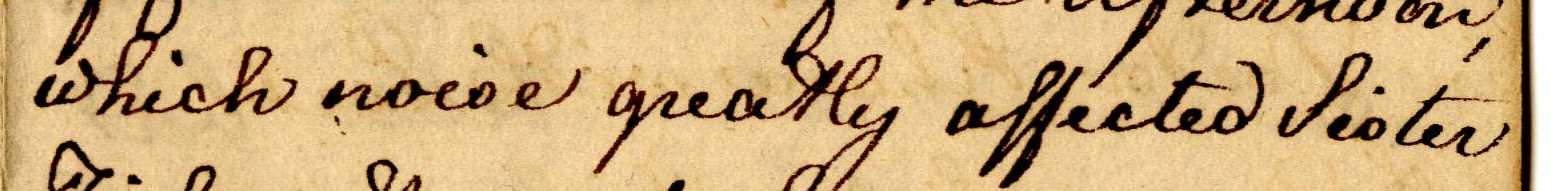which noise greatly affected Sister
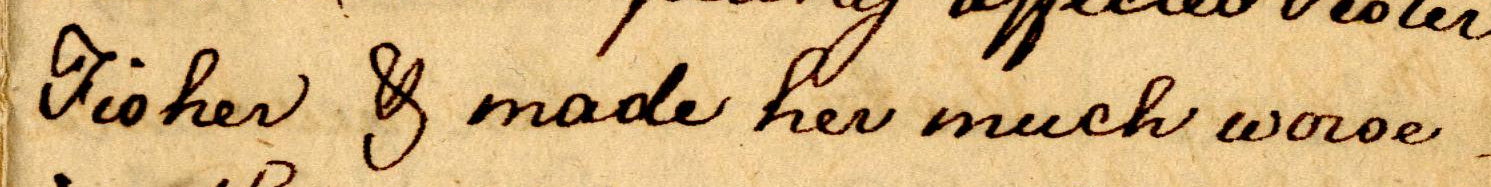Fisher & made her much worse
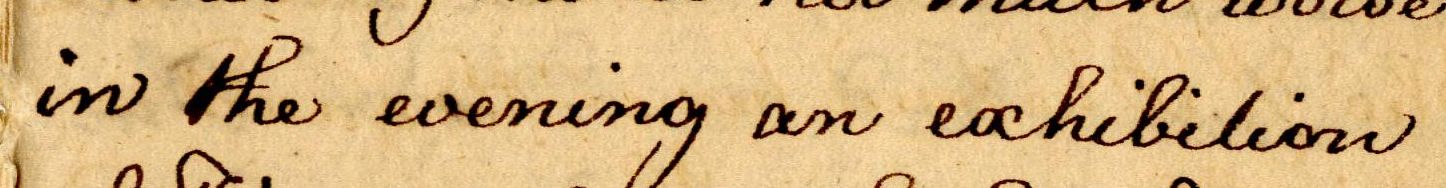in the evening an exhibition
